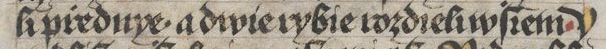li pṙednye.a dwie rybie rozdieli wẛiem.Y
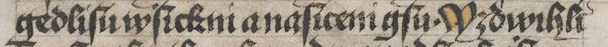gedliſu wẛickni a naſiceni gſu.Yzdwihli
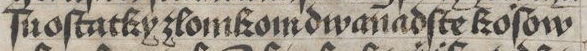ſu oſtatky zlomkoni dwanadſte koẛow
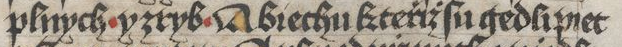plnych.y zryb.A bíechu kteříż ſu gedli piet
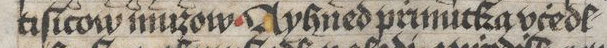tiſicow. muzow.Ayhned pṙinutka vċedl¬
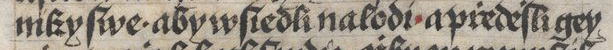niky ſwe.aby wſiedli nalodí.a pṙedeẛli gey
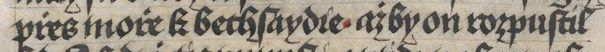pṙes moṙe k bethſaydie.aż by on rozpuſtil
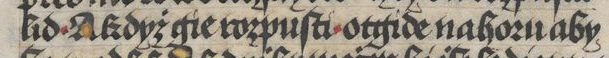lid.A kdyż gie rozpuſto.otgide nahoru aby
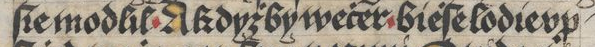ſie modlil.A když by weċer.bíeẛe lodie rp¬
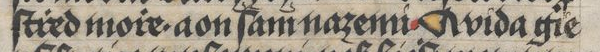ſtṙed moṙe.a on ſam nazemi.A vida gie
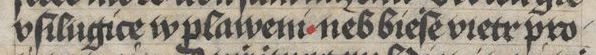vſilugíce w plaweni.neb bíeẛe vzetr pro¬
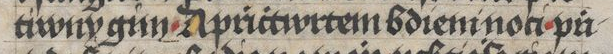tiwny gim.A pṙiċtwrtem bdieni noci.pṙi¬
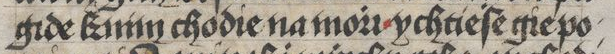gide knim chodie na moṙi.y chtíeẛe gie po¬
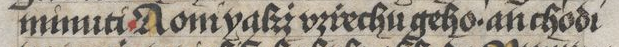minuti.A oni yakż vzṙechu geho.an chodí
